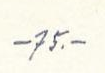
75
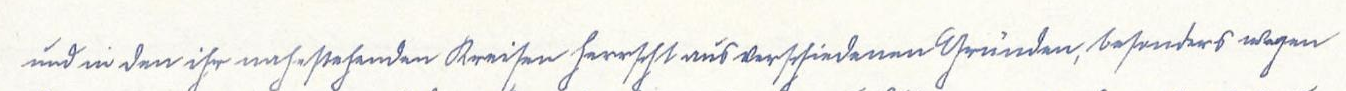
und in den ihr nahe stehenden Kreisen herrscht aus verschiedenen Gründen, besonders wegen
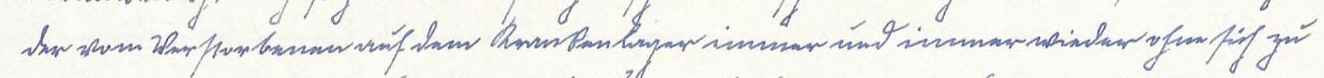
der vom Verstorbenen auf dem Krankenlager immer und immer wieder ohne sich zu
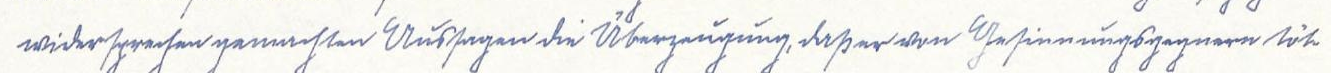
widersprechen gemachten Aussagen die Überzeugung, daß er von Gesinnungsgegnern töt-
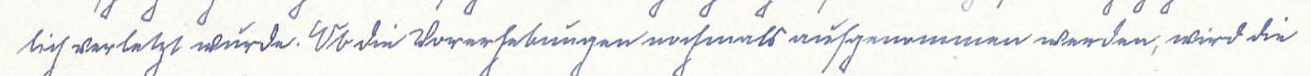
lich verletzt wurde. Ob die Vorerhebungen nochmals aufgenommen werden, wird die
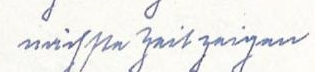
nächste Zeit zeigen.
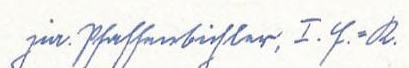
jur. Pfaffenbichler, I F-K.
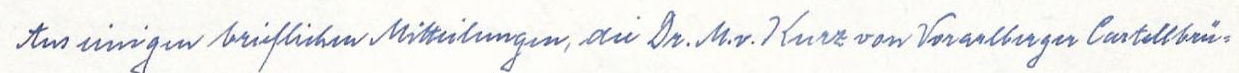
Aus einigen brieflichen Mitteilungen, die Dr. M. v. Kurz von Vorarlberger Cartellbrü-
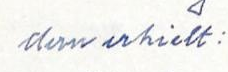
dern erhielt:
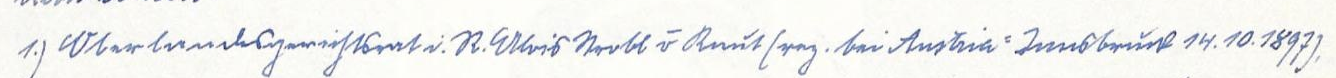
1) Oberlandesgerichtsrat i. R. Alois Strobl v/o Knut (rez. bei Austria-Innsbruck 14.10.1897),
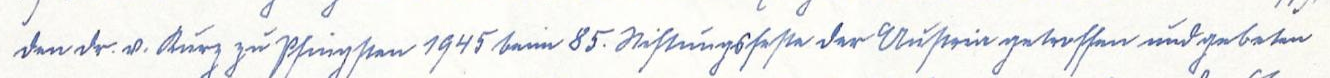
den Dr. v. Kurz zu Pfingsten 1945 beim 85. Stiftungs Feste der Austria getroffen und gebeten
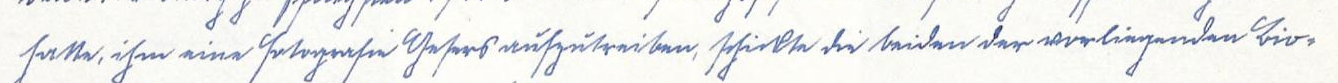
hatte, ihm eine Fotografie Gesers aufzutreiben, schickte die beiden der vorliegenden Bio-
